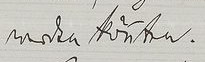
werden könnten.
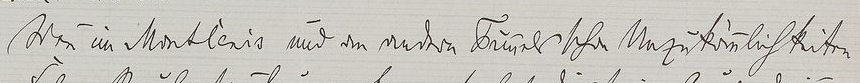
Wenn im Mont Cenis und den andern Tunnels schon Unzukömmlichkeiten
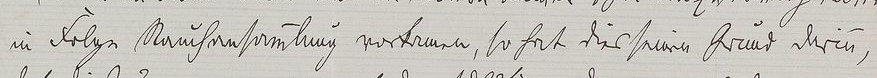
in Folge Rauchansammlung vorkamen, so hat dies seinen Grund darin,
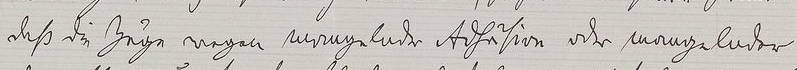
daß die Züge wegen mangelnder Adhäsion oder mangelnder
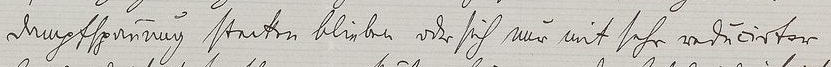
Dampfspannung stecken blieben oder sich nur mit sehr reducirter
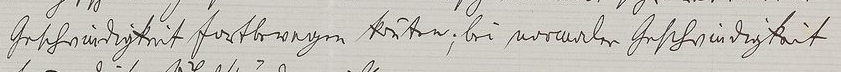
Geschwindigkeit fortbewegen konnten; bei normaler Geschwindigkeit
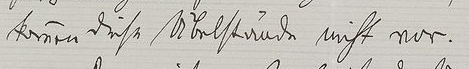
kommen diese Übelstände nicht vor.
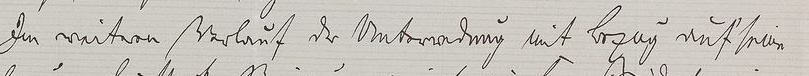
Im weitern Verlauf der Unterredung mit Bezug auf seine
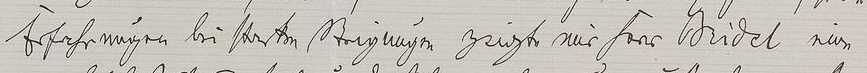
Erfahrungen bei starken Steigungen zeigte mir Herr Bridel eine
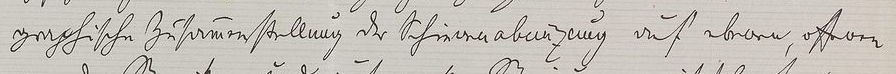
graphische Zusammenstellung der Schienenabnüzung auf ebenen, offenen
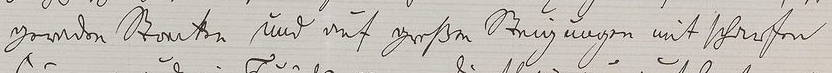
geraden Strecken und auf großen Steigungen mit scharfen
